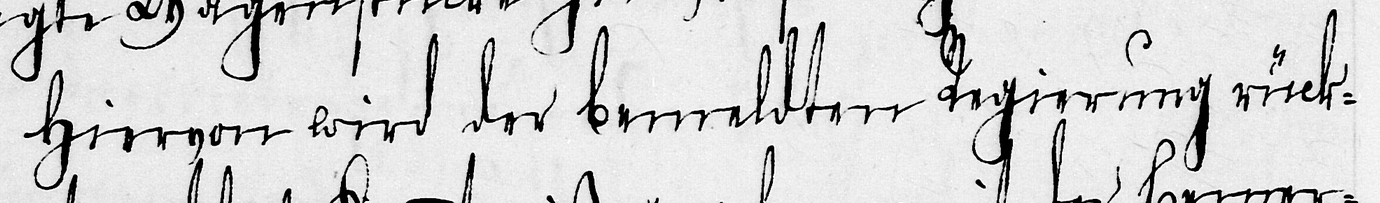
Hiervon wird der bemeldten Regierung rück¬
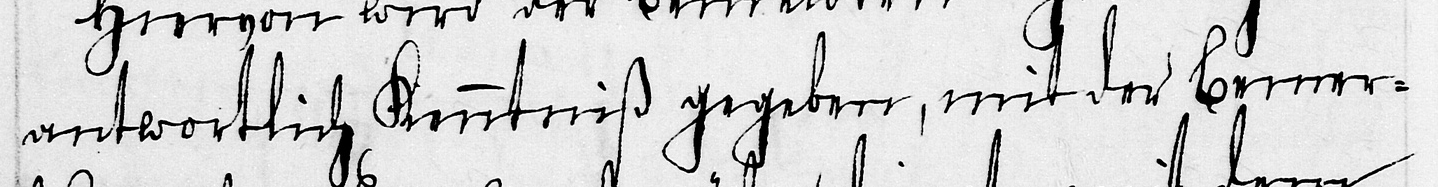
antwortlich Kenntniß gegeben, mit der Bemer¬
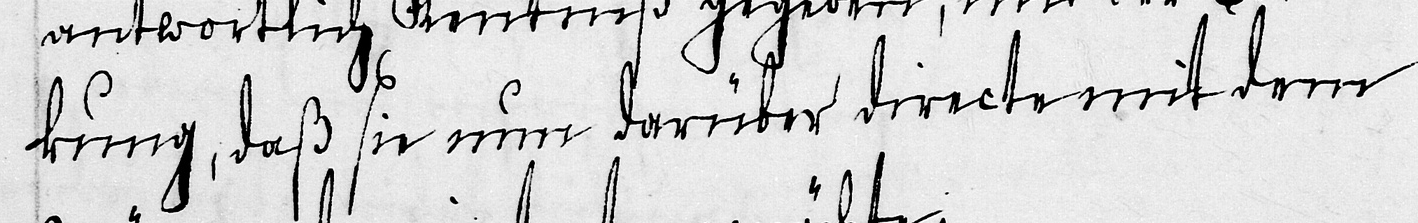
kung, daß sie nun darüber directe mit dem
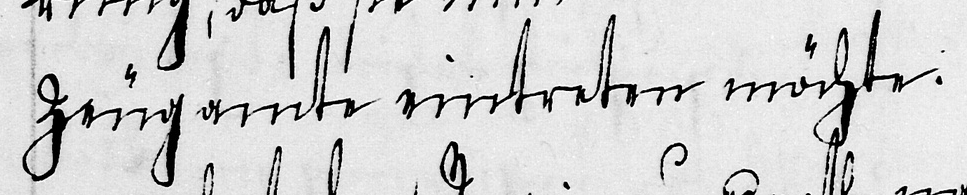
Zeugamte eintreten möchte.
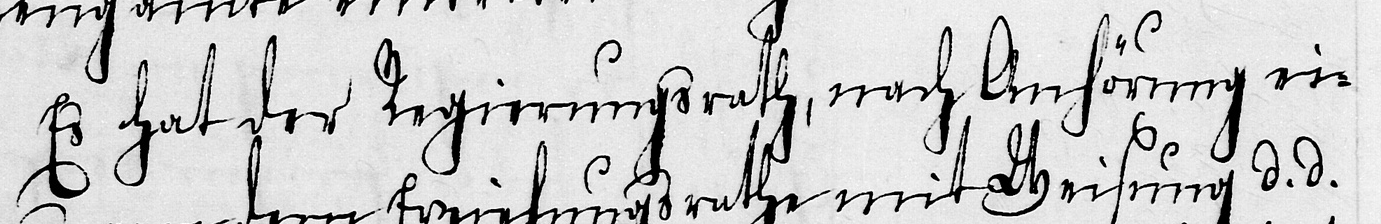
Es hat der Regierungsrath, nach Anhörung ei¬
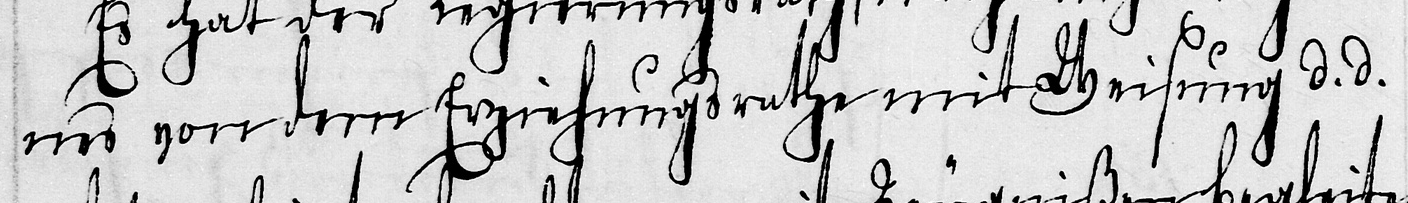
nes von dem Erziehungsrathe mit Weisung d. d.
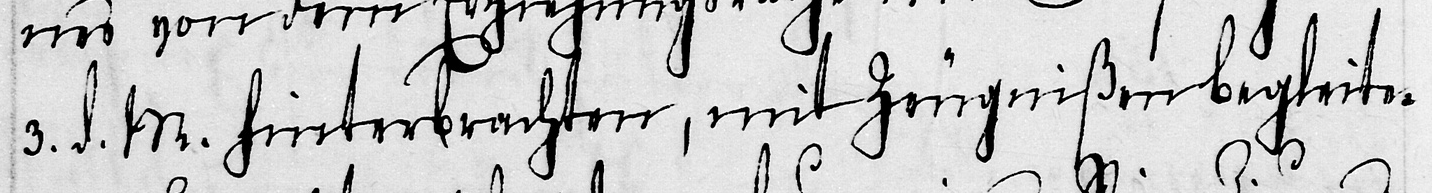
3. d. M. hinterbrachten, mit Zeugnißen begleite¬
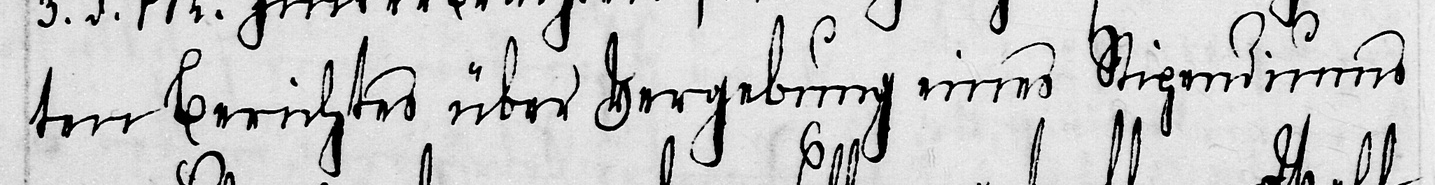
ten Berichtes über Vergebung eines Stipendiums
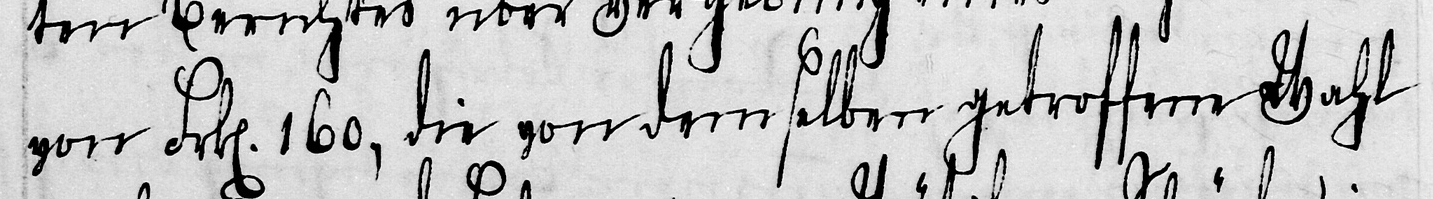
von Frk[en]. 160, die von demselben getroffene Wahl
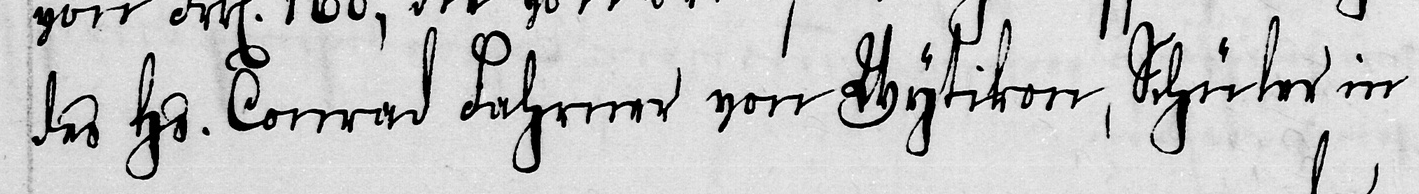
des Hs. Conrad Fahrner von Wytikon, Schüler in
